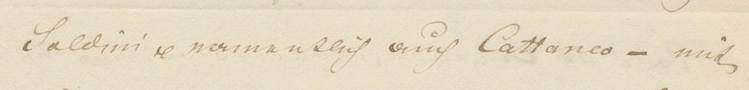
Soldini & namentlich auch Cattaneo – mit
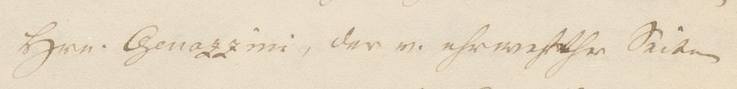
Hrn. Genazzini, der v. ehrwerther Seite
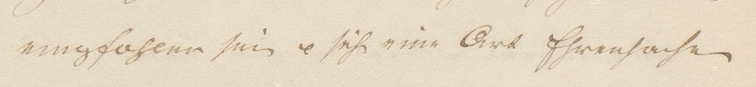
empfohlen sei & sich eine Art Ehrensache
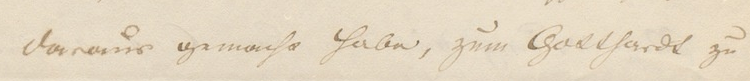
daraus gemacht habe, zum Gotthardt zu
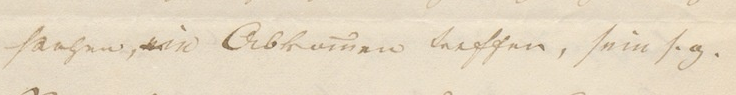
stehen, und ein Abkommen treffen, sein s.g.
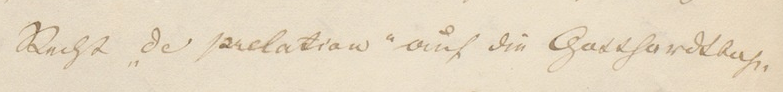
Recht «de prelation» auf die Gotthardtbahn
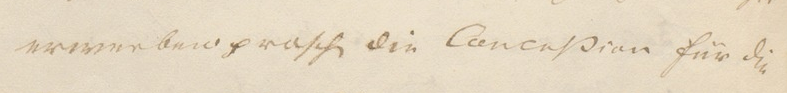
erwerben & rasch die Conceßion für die
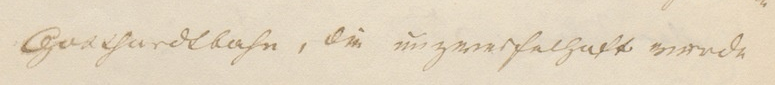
Gotthardbahn, die unzweifelhaft würde
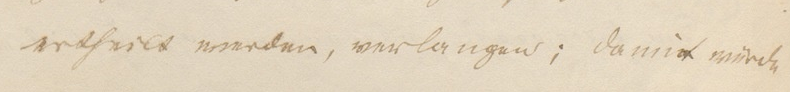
ertheilt werden, verlangen; damit würde
